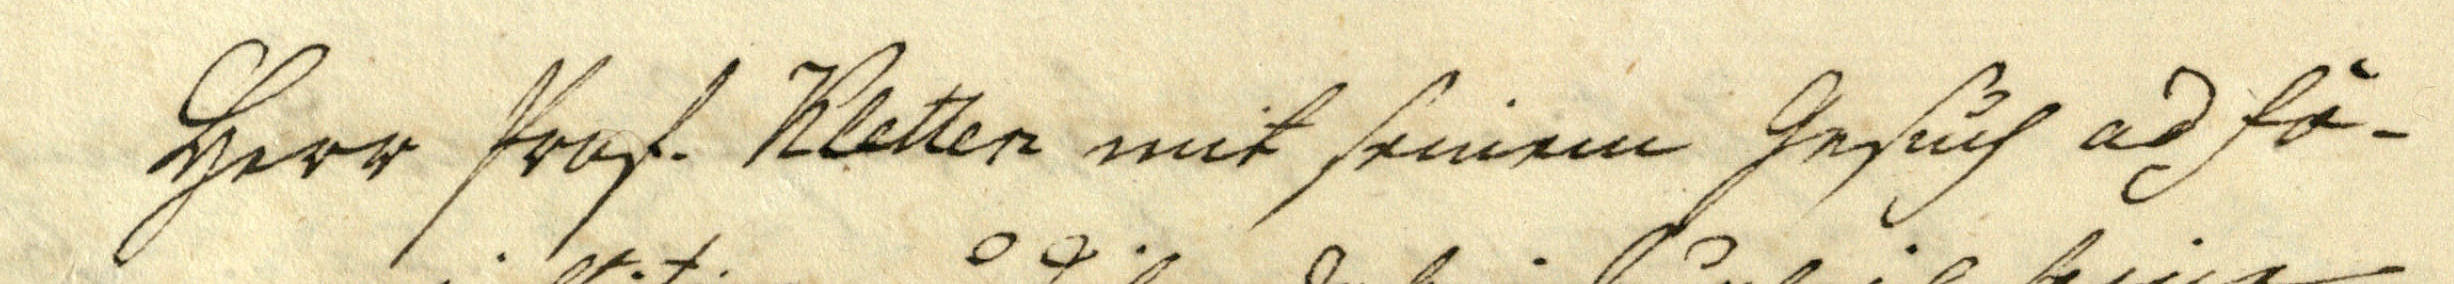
Herr Prof. Kletten mit seinem Gesuch ad fo¬
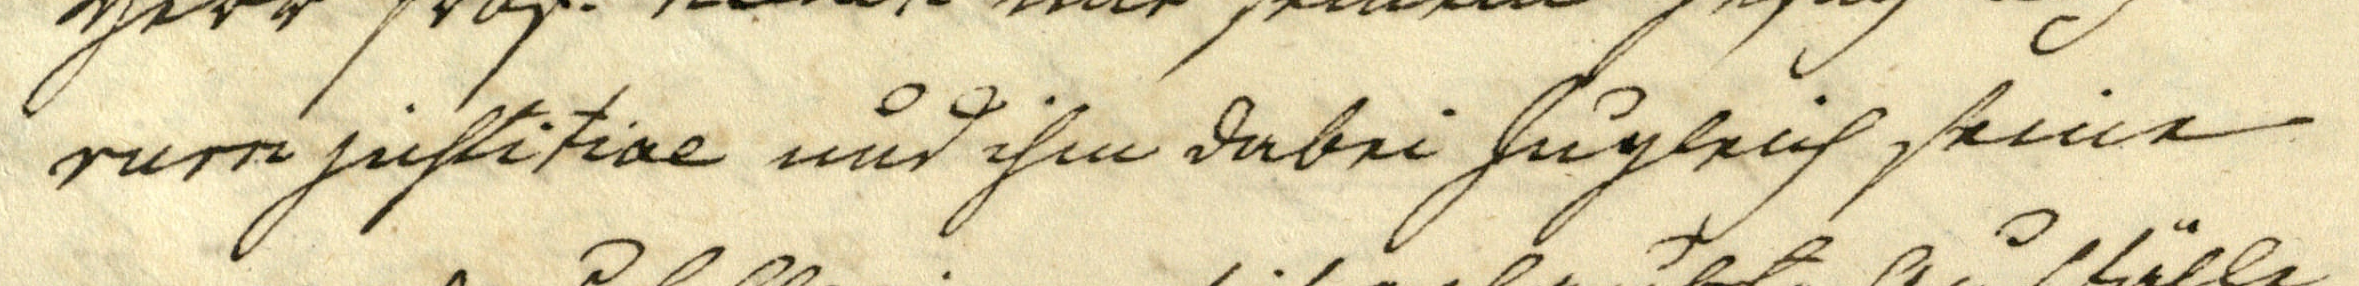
rum justitiae und ihm dabei zugleich seine
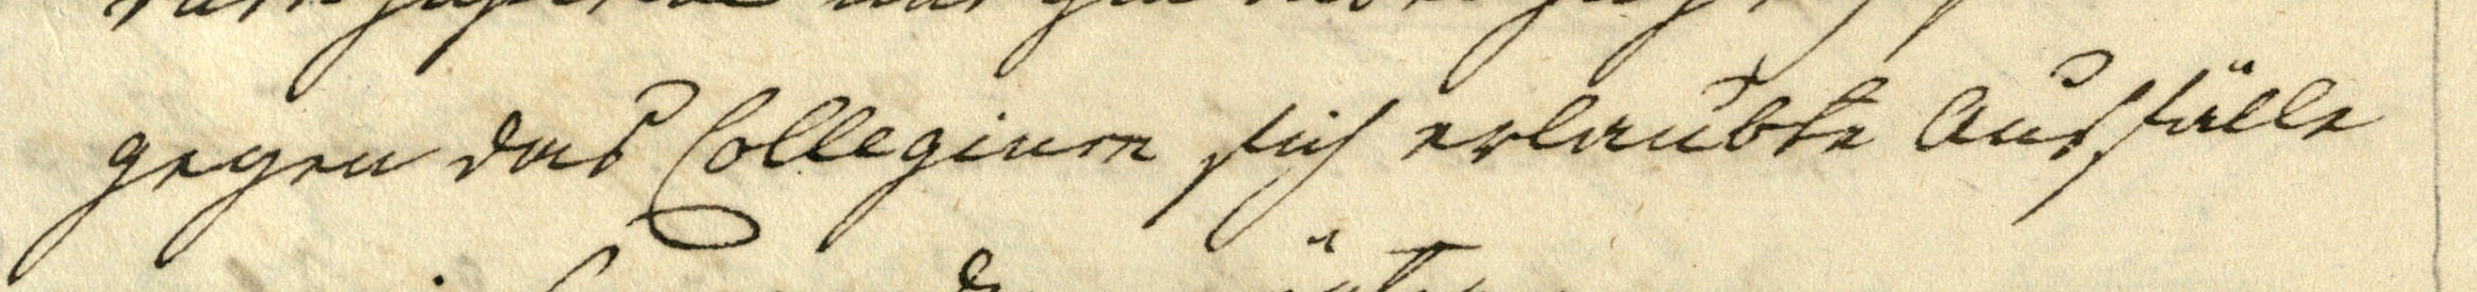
gegen das Collegium sich erlaubte Ausfälle
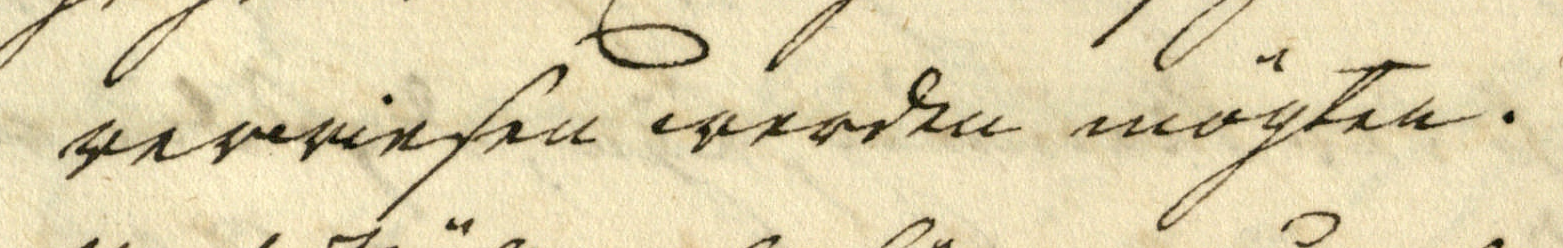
verwiesen werden mögten.
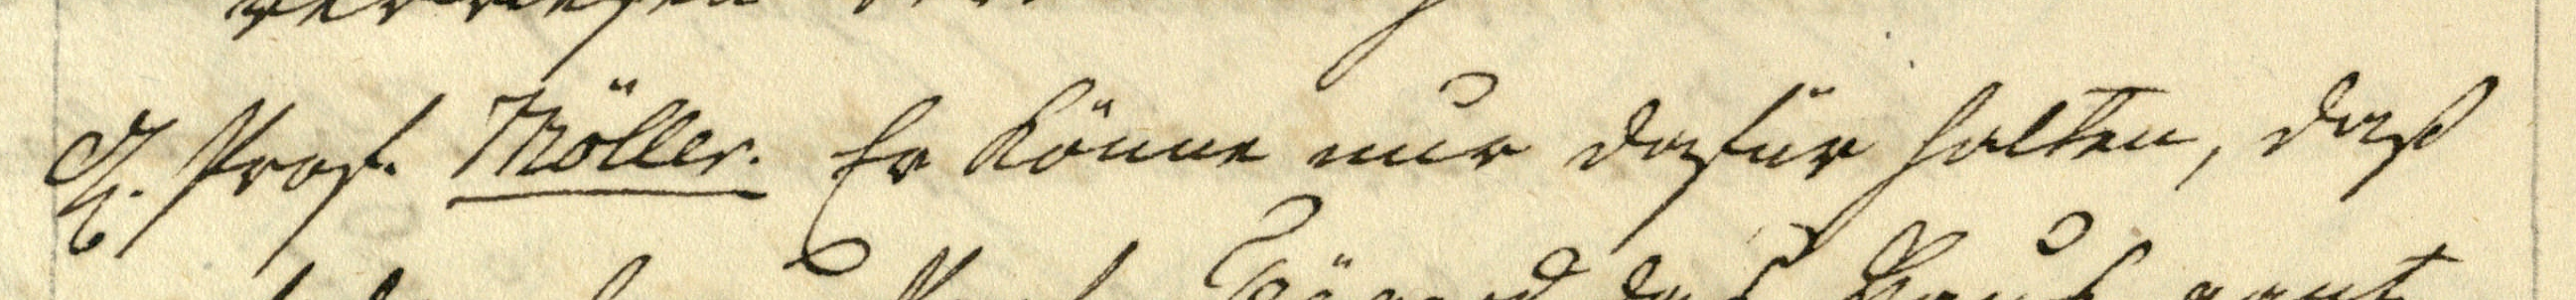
dh. Prof. Möller. Er könne nur dafür halten, daß
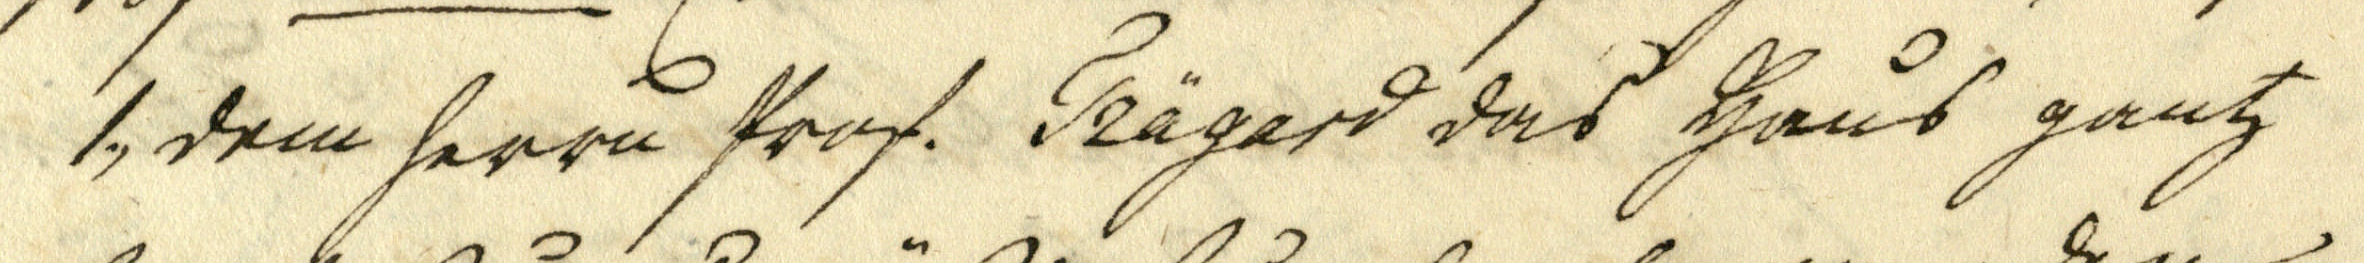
1, dem Herrn Prof. Trägård das Haus gantz
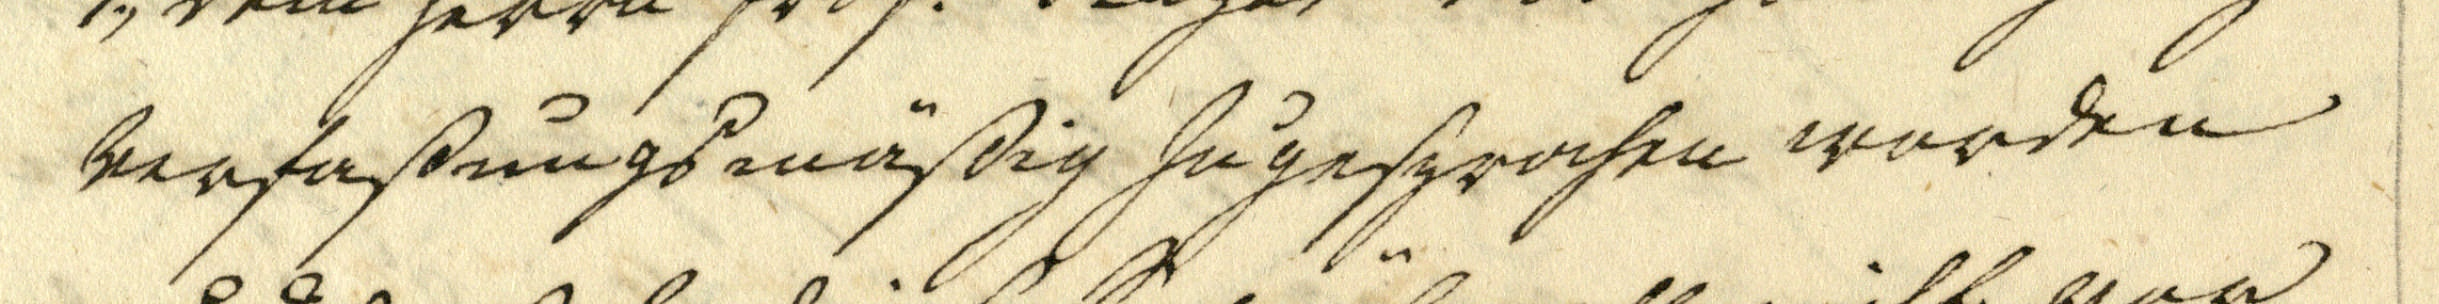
verfaßungsmässig zugesprochen worden
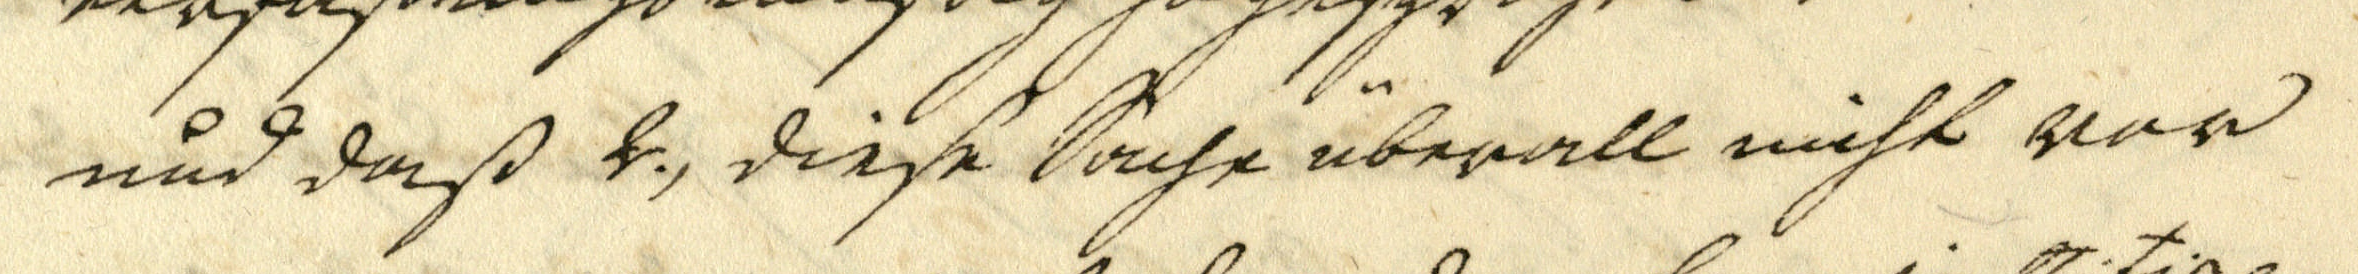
und daß 2., diese Sache überall nicht vor
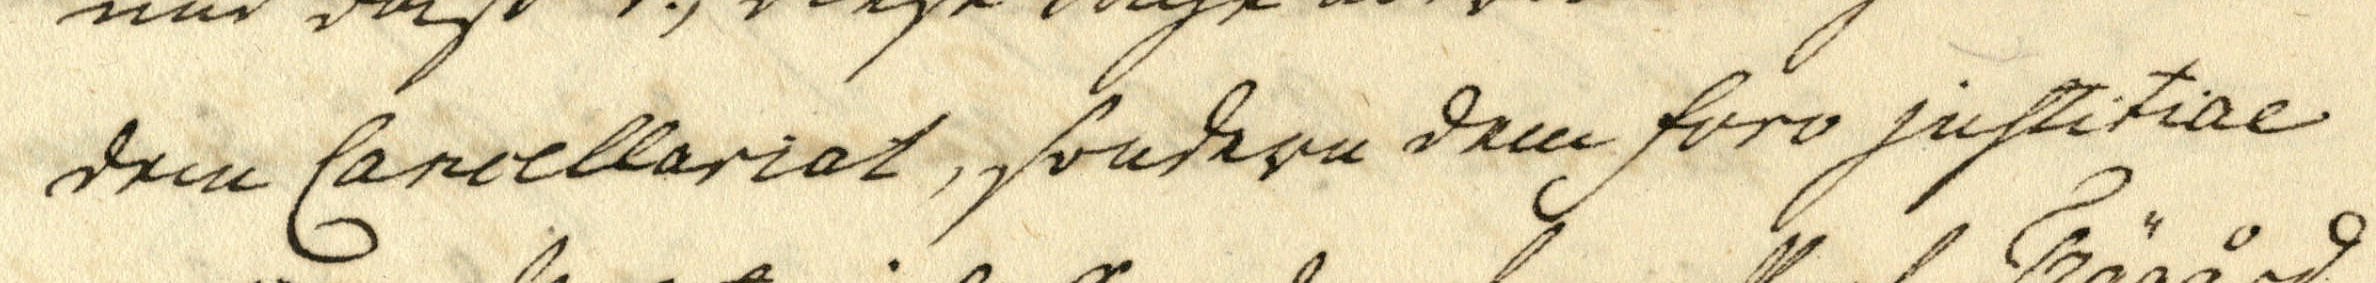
dem Cancellariat, sondern dem foro justitiae
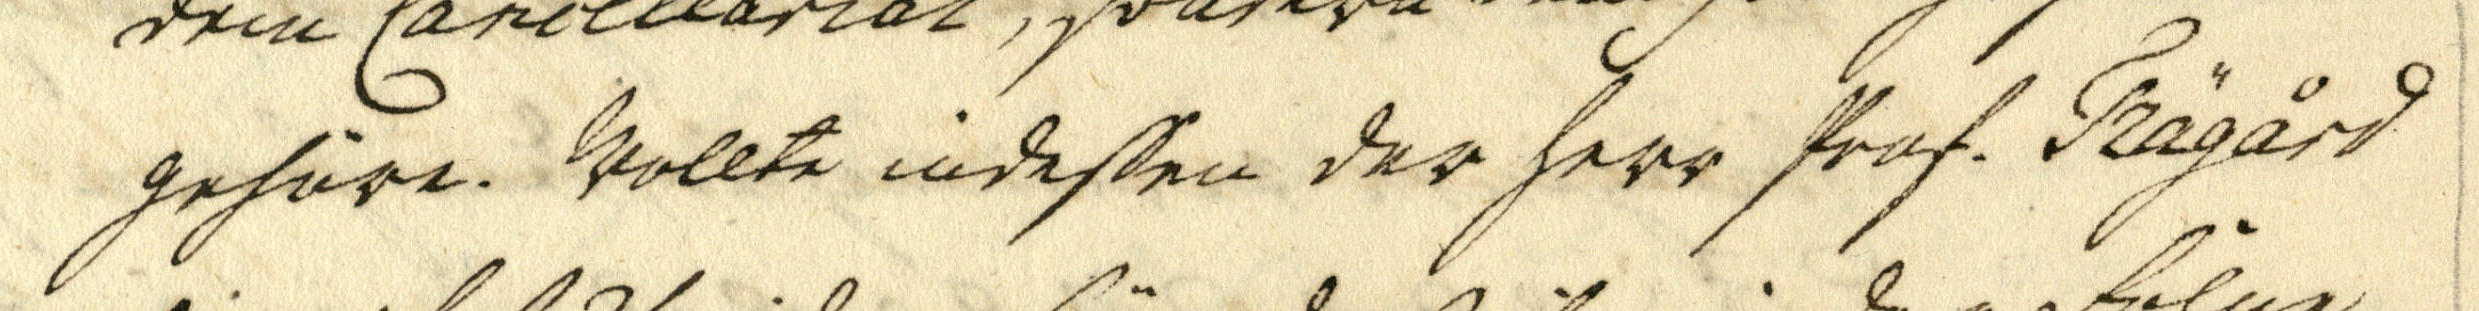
gehöre. Wollte indessen der Herr Prof. Trägård
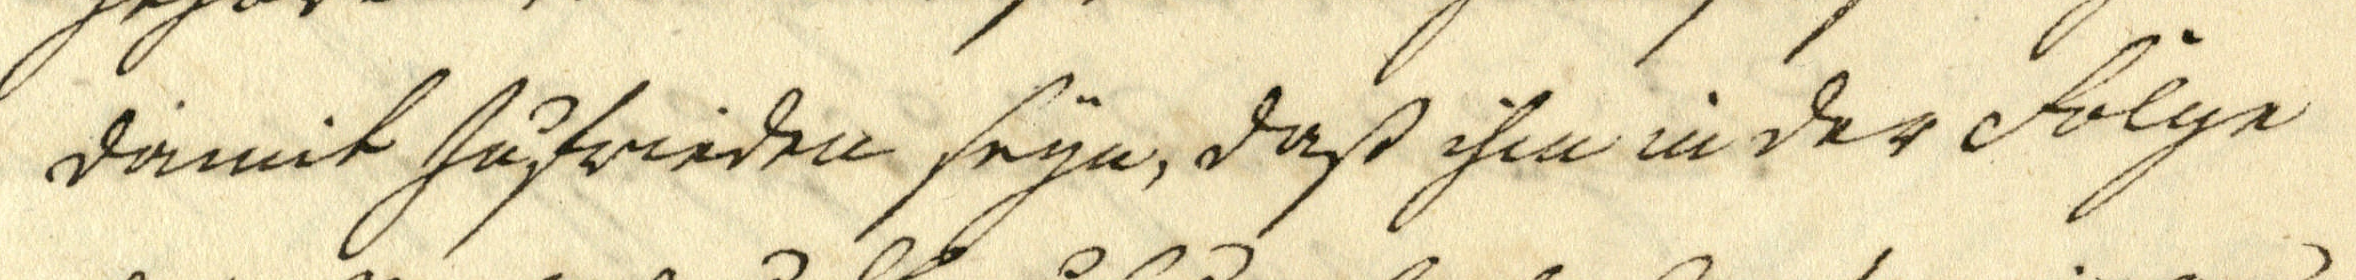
damit zufrieden seÿn, daß ihm in der Folge
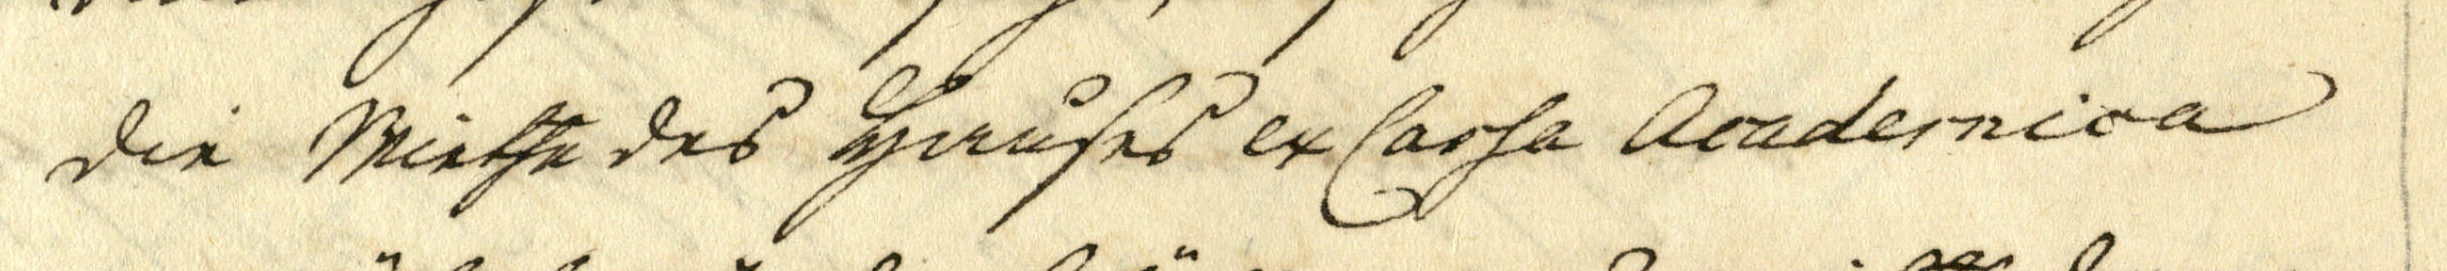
die Miethe des Hauses ex Cassa Academica
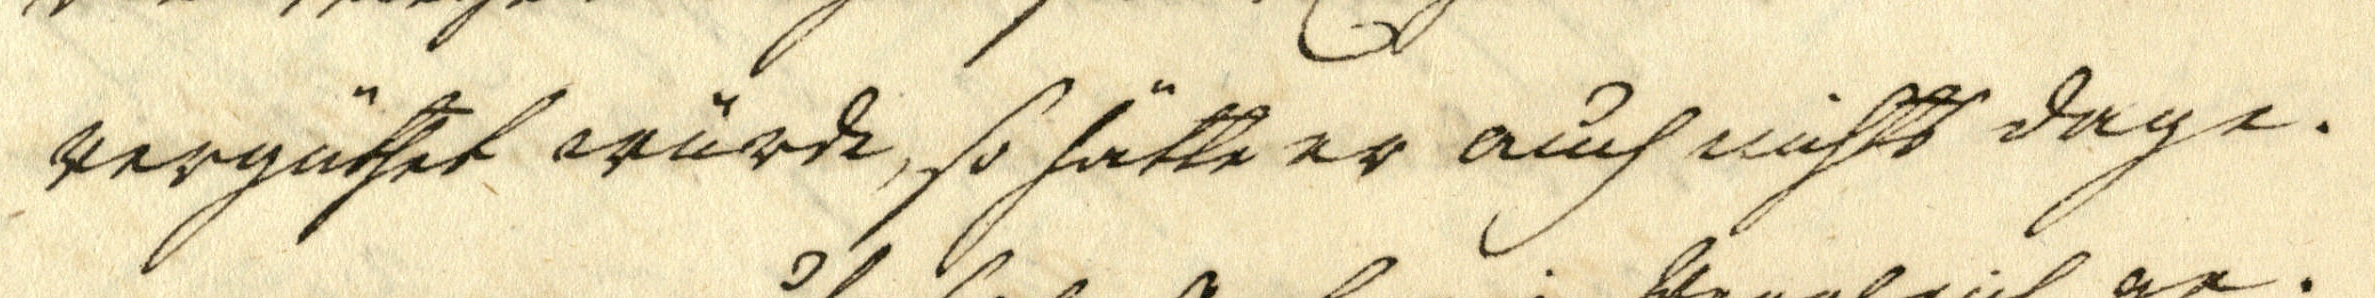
vergüthet würde, so hätte er auch nichts dage¬
